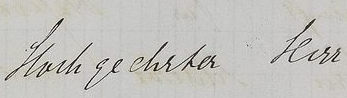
Hochgeehrter Herr
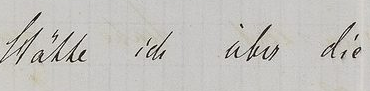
Hätte ich über die
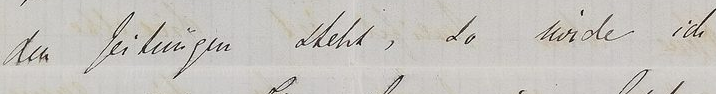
den Zeitungen steht, so würde ich
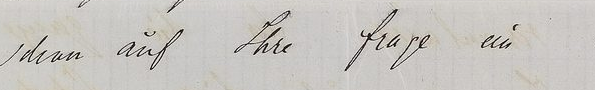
schon auf Ihre Frage im
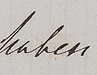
letzten
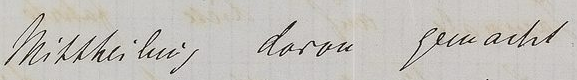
Mittheilung davon gemacht
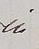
haben.
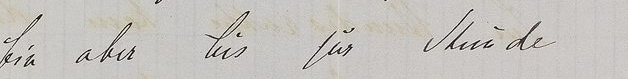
bin aber bis zur Stunde
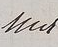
noch in
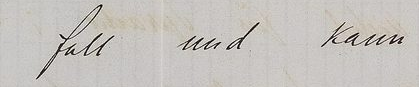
Fall und kann
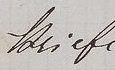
Ihnen nur
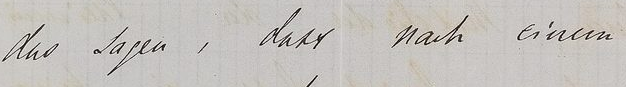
das sagen, dass nach einem
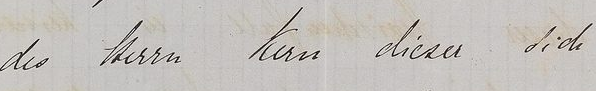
des Herrn Kern dieser sich
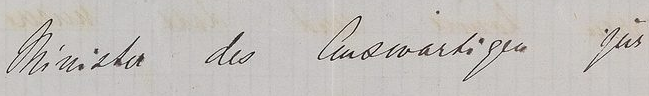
Minister des Auswärtigen zur
